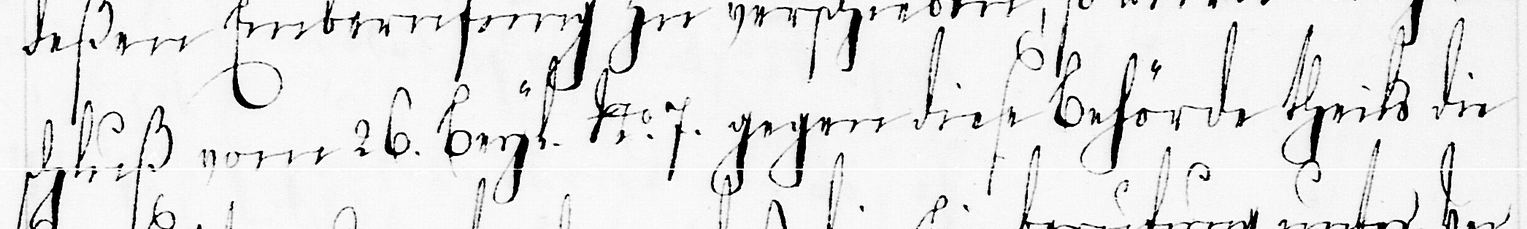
schluß vom 26. Beyl. No. 7. gegen diese Behörde theils die
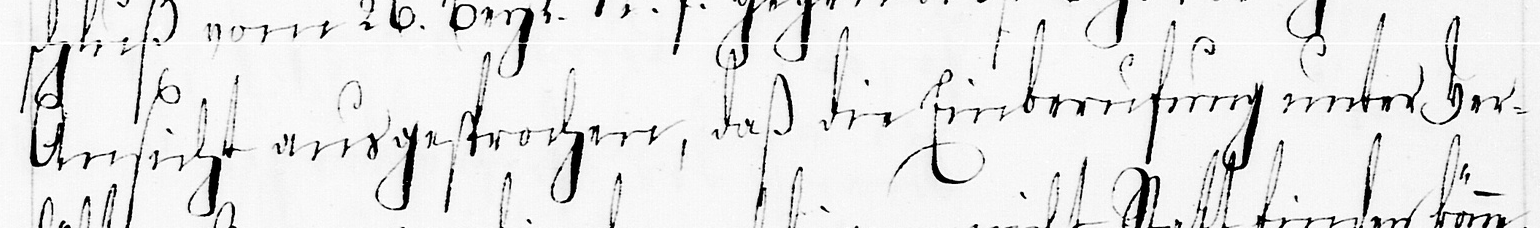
Ansicht ausgesprochen, daß die Einberufung unter Ver¬
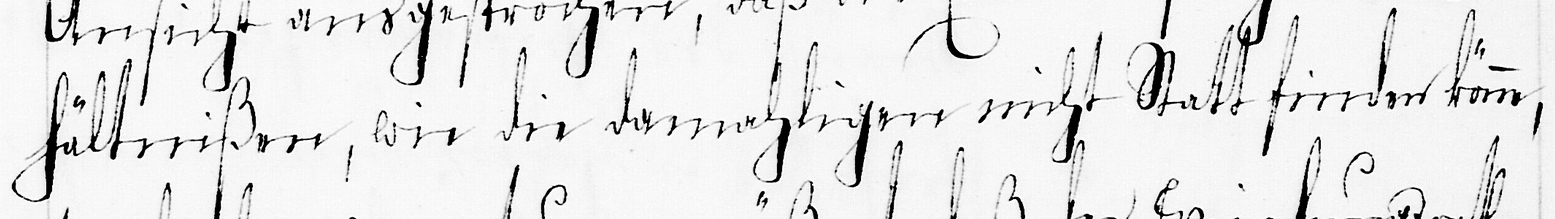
hältnißen, wie die damahligen nicht Statt finden könn¬
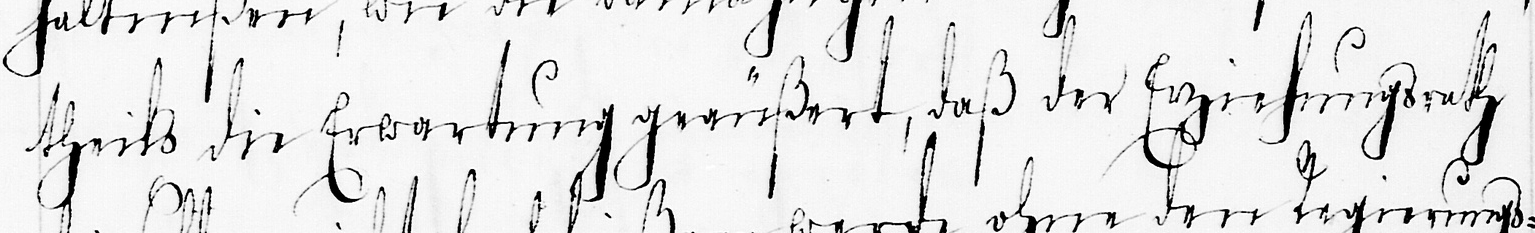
theils die Erwartung geäußert, daß der Erziehungsrath
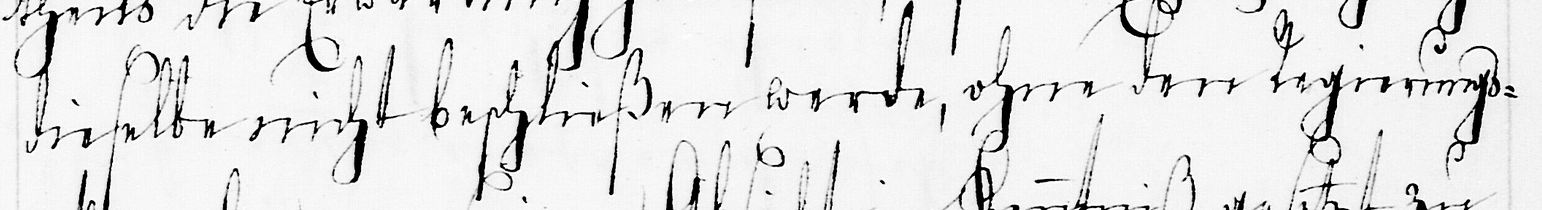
dieselbe nicht beschließen werde, ohne den Regierungs¬
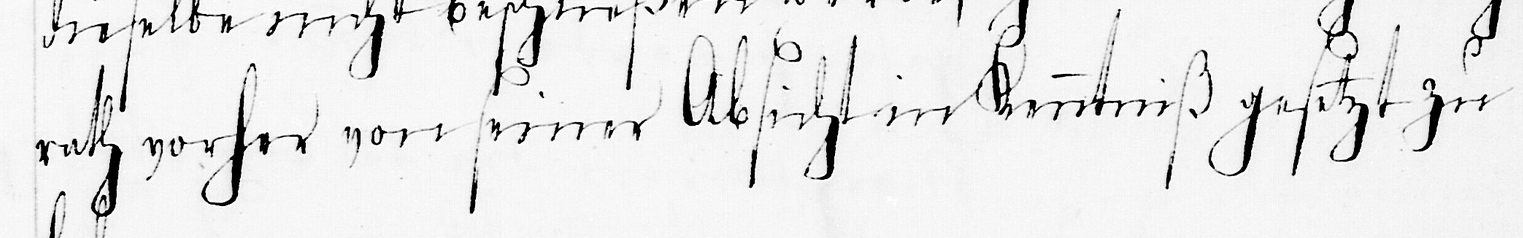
rath vorher von seiner Absicht in Kenntniß gesetzt zu
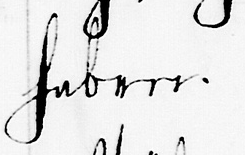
haben.
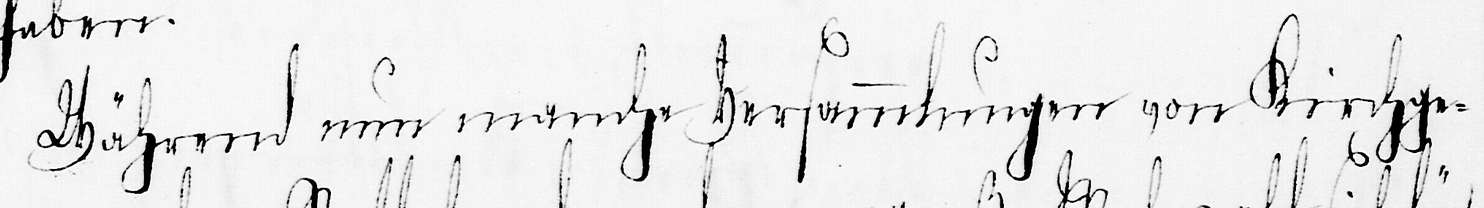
Während nun manche Versammlungen von Kirchge¬
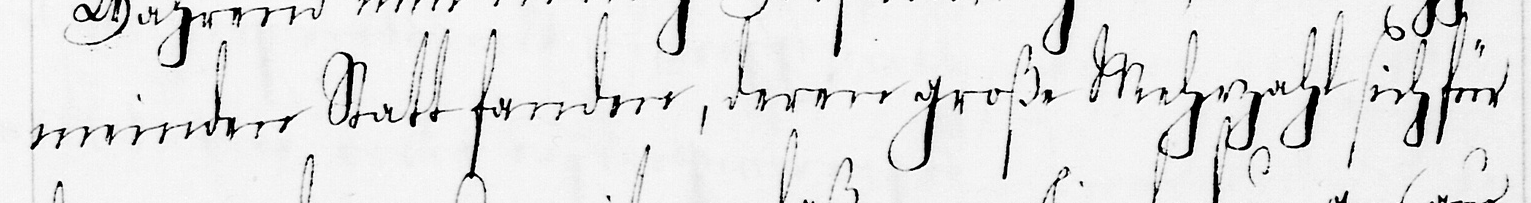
meinden Statt fanden, deren große Mehrzahl sich für
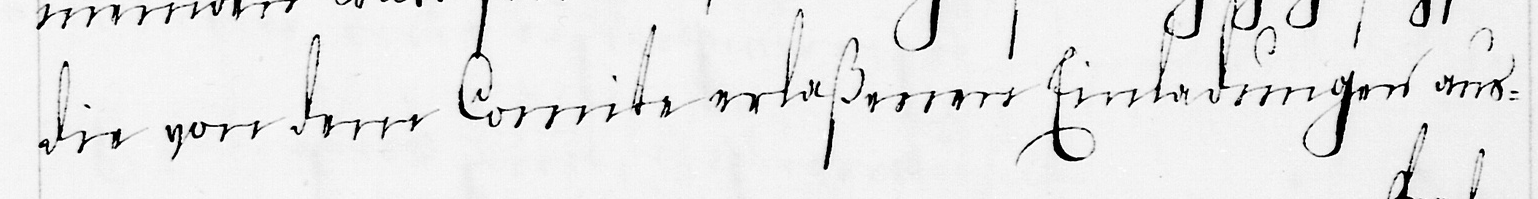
die von dem Comite erlaßenen Einladungen aus-
